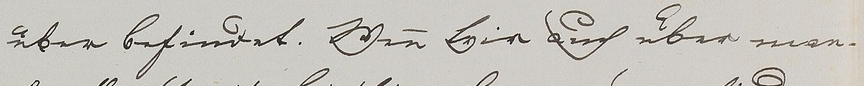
über befindet. Wenn wir auch über man-
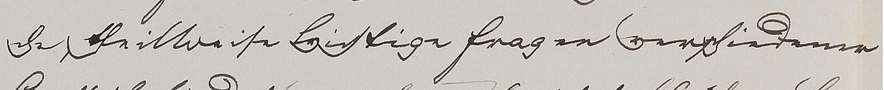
che, theilweise wichtige Fragen verschiedener
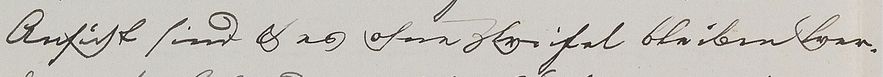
Ansicht sind & es ohne Zweifel bleiben wer-
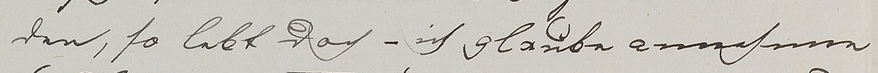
den, so lebt doch – ich glaube annehmen
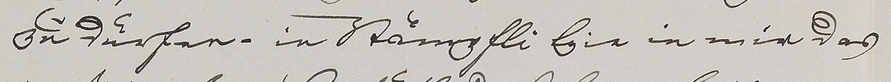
zu dürfen – in Stämpfli wie in mir das
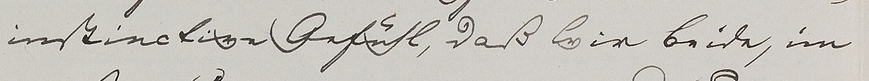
instinctive Gefühl, daß wir beide, im
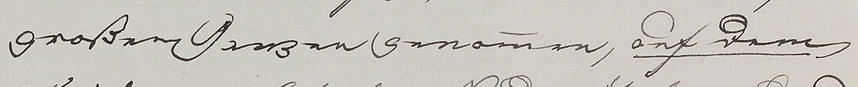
großen Ganzen genommen, auf dem
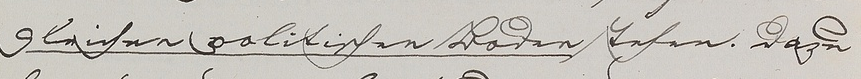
gleichen politischen Boden stehen. Dazu
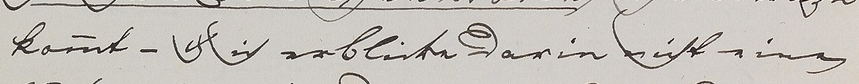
kommt – & ich erblicke darin nicht eine
